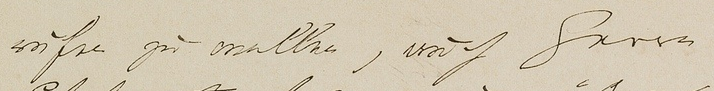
rufen zu wollen, auch Herrn
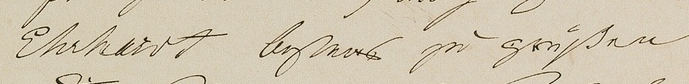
Ehrhardt bestens zu grüßen.
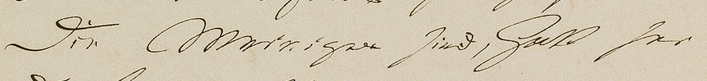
Die Meinigen sind, Gott sei
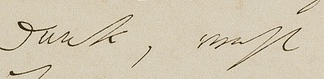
Dank, wohl.
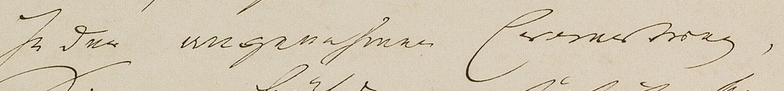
In der angenehmen Erwartung,
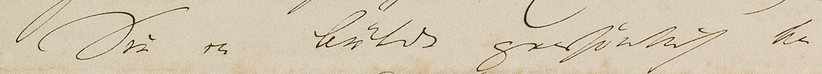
Sie in Bälde persönlich be-
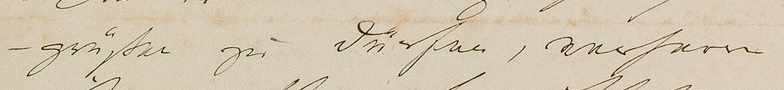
grüßen zu dürfen,verharre
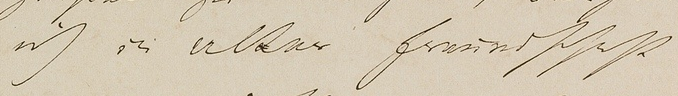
ich in alter Freundschaft
